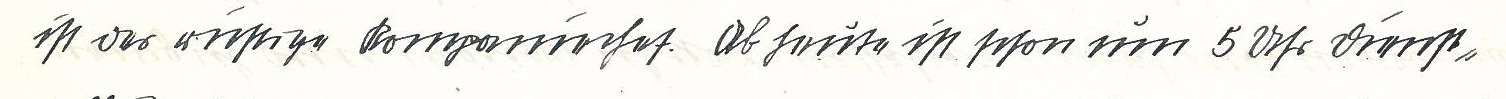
ist der richtige Kompaniechef. Ab heute ist schon um 5 Uhr Dienst¬
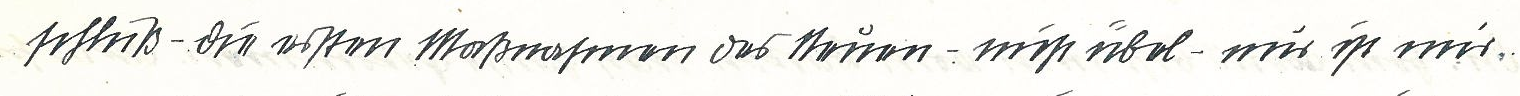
schluß – die ersten Maßnahmen des Neuen – nicht übel – nur ist mir
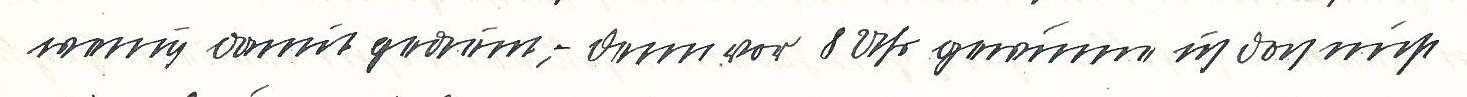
wenig damit gedient, – denn vor 8 Uhr gewönne ich doch nicht
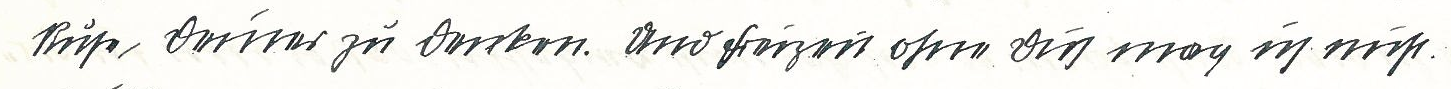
Ruhe, Deiner zu denken. Und Freizeit ohne Dich mag ich nicht.
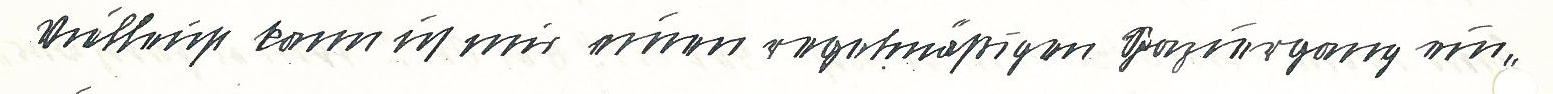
Vielleicht kann ich mir einen regelmäßigen Spaziergang ein¬
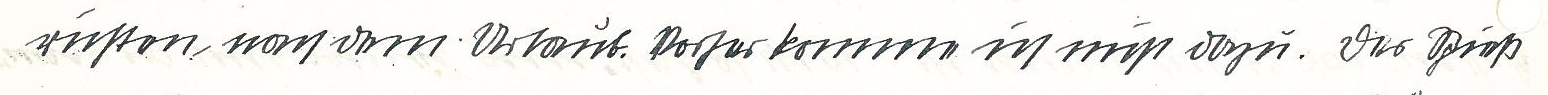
richten, nach dem Urlaub. Vorher komme ich nicht dazu. Der Spieß
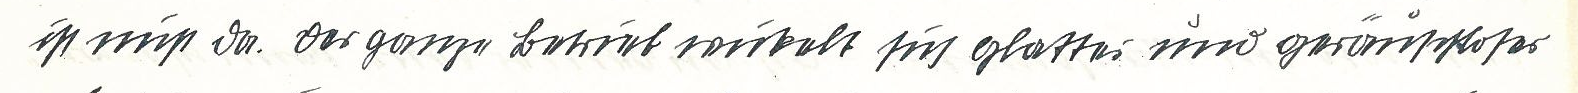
ist nicht da. Der ganze Betrieb wickelt sich glatter und geräuschloser
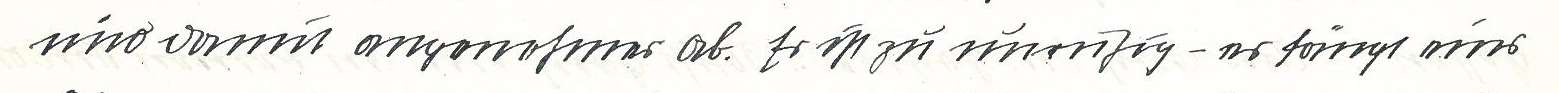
und damit angenehmer ab. Er ist zu unruhig – er fängt eins
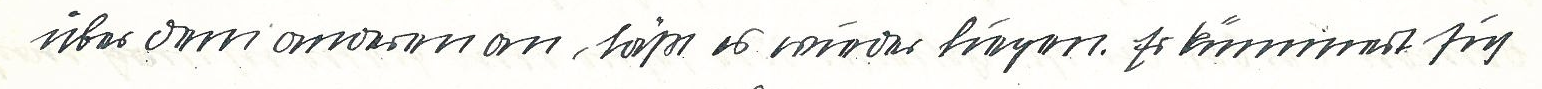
über dem anderen an, lässt es wieder liegen. Er kümmert sich
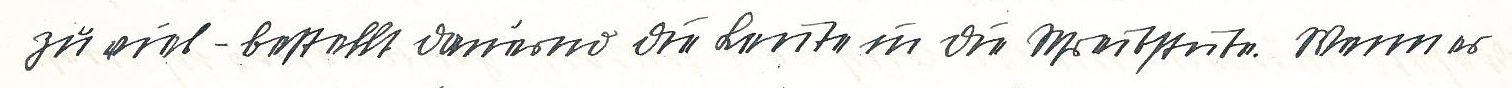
zu viel – bestellt dauernd die Leute in die Schreibstube. Wenn er
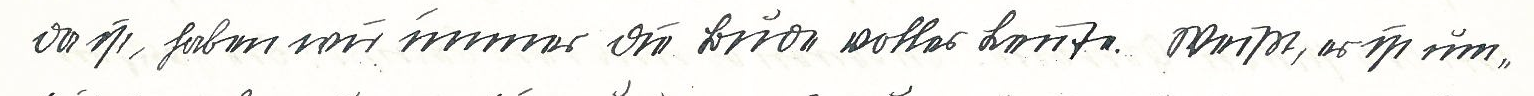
da ist, haben wir immer die Bude voller Leute. Weißt, er ist um¬
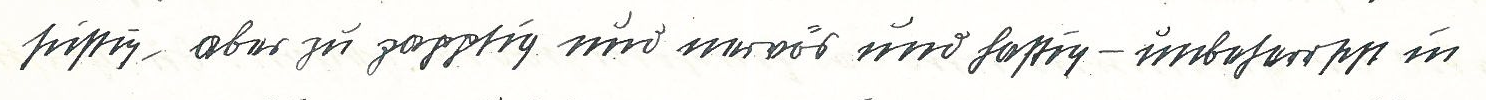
sichtig, aber zu zapplig und nervös und hastig – unbeherrscht in
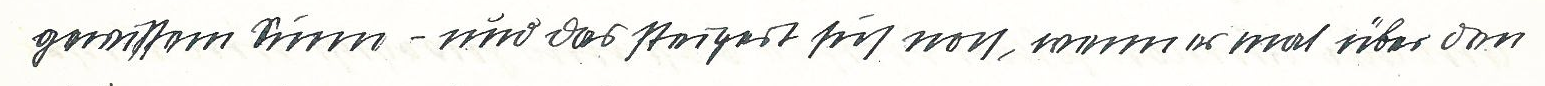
gewissem Sinn – und das steigert sich noch, wenn er mal über den
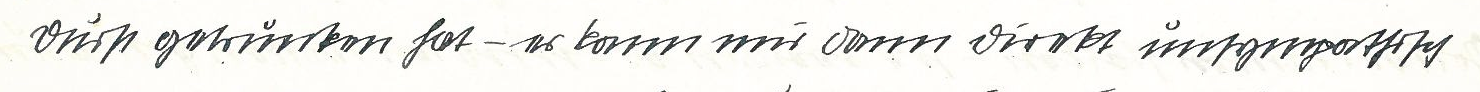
Durst getrunken hat – er kann mir dann direkt unsympathisch
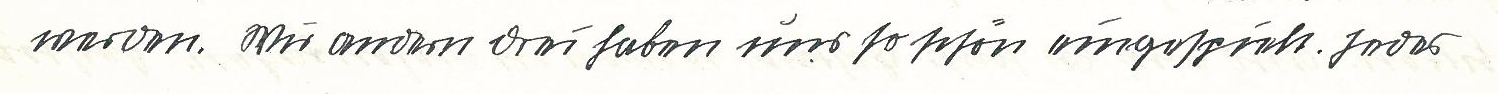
werden. Wir andern drei haben uns so schön eingespielt. Jeder
